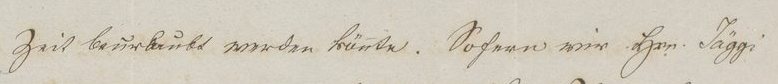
Zeit beurlaubt werden könnte. Sofern wir Hrn. Jäggi
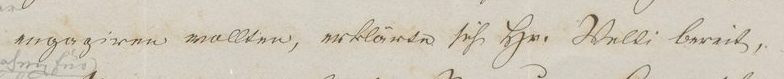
engagiren wollten, erklärte sich Hr. Welti bereit,
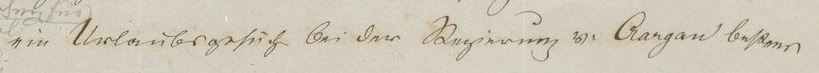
ein Urlaubsgesuch bei der Regierung v. Aargau bestens
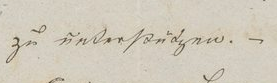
zu unterstützen. –
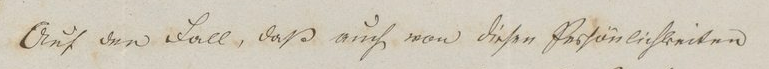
Auf den Fall, daß auch von diesen Persönlichkeiten
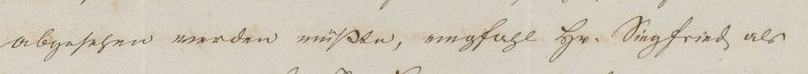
abgesehen werden müßte, empfahl Hr. Siegfried als
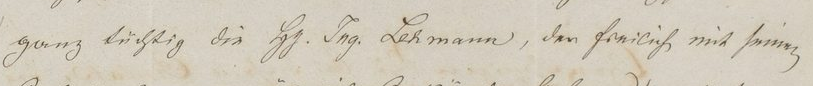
ganz tüchtig die Hh. Ing. Lehmann, der freilich mit seinen
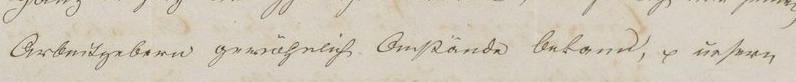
Arbeitgebern gewöhnlich Anstände bekam, & unsern
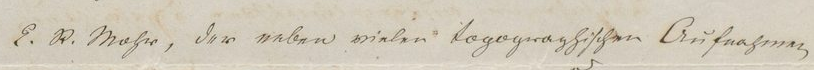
E. R. Mohr, der neben vielen topographischen Aufnahmen
